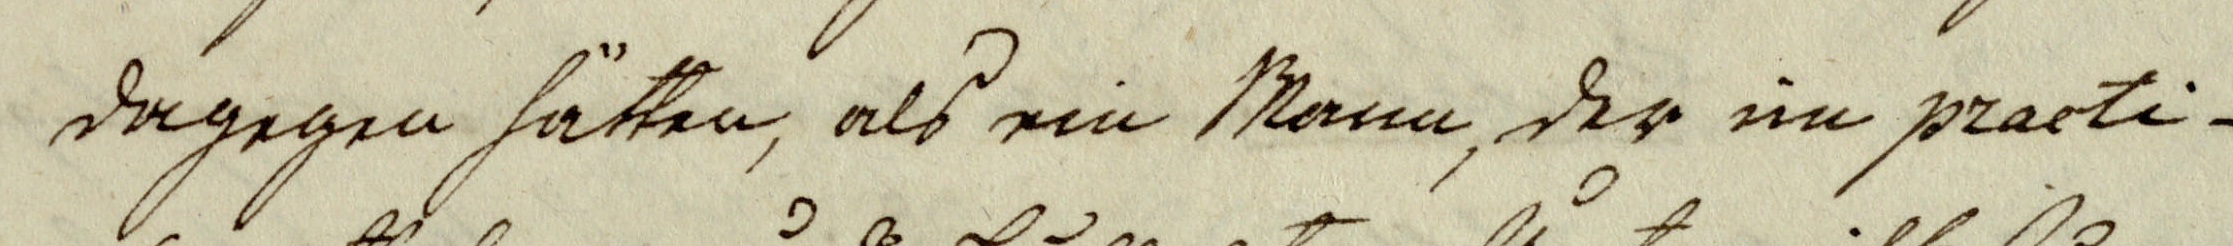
dagegen hätten, als ein Mann, der im practi¬
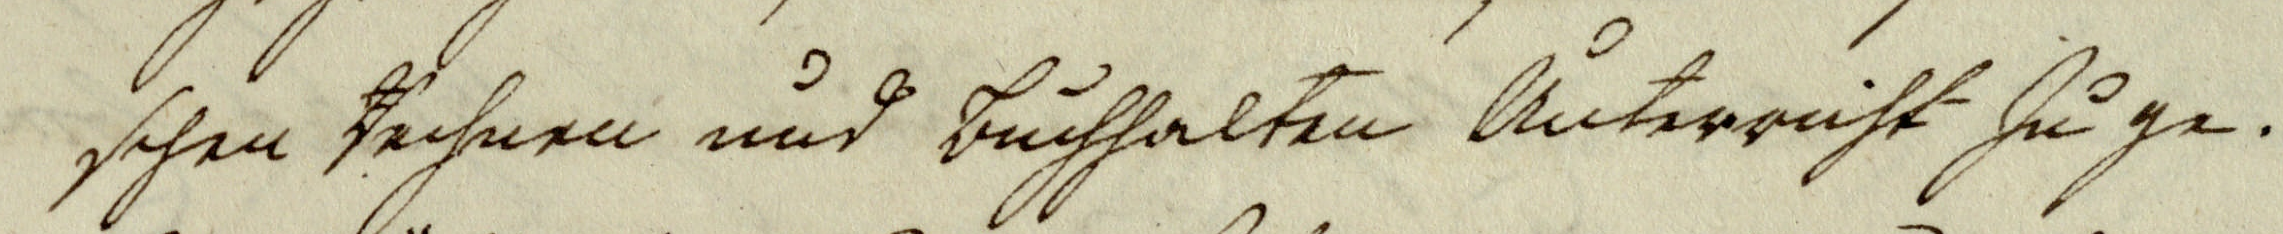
schen Rechnen und Buchhalten Unterricht zu ge¬
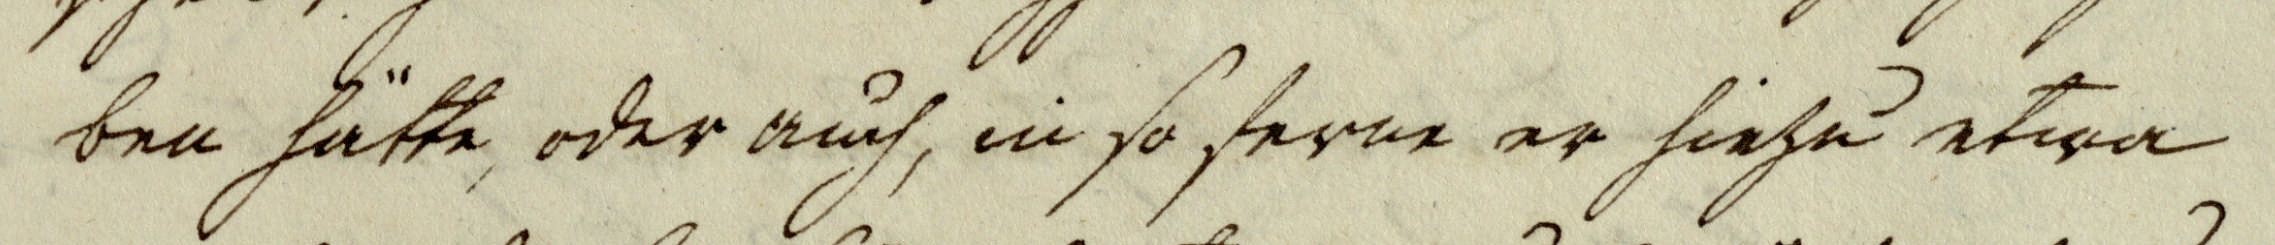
ben hätte, oder auch, in so fern er hiezu etwa
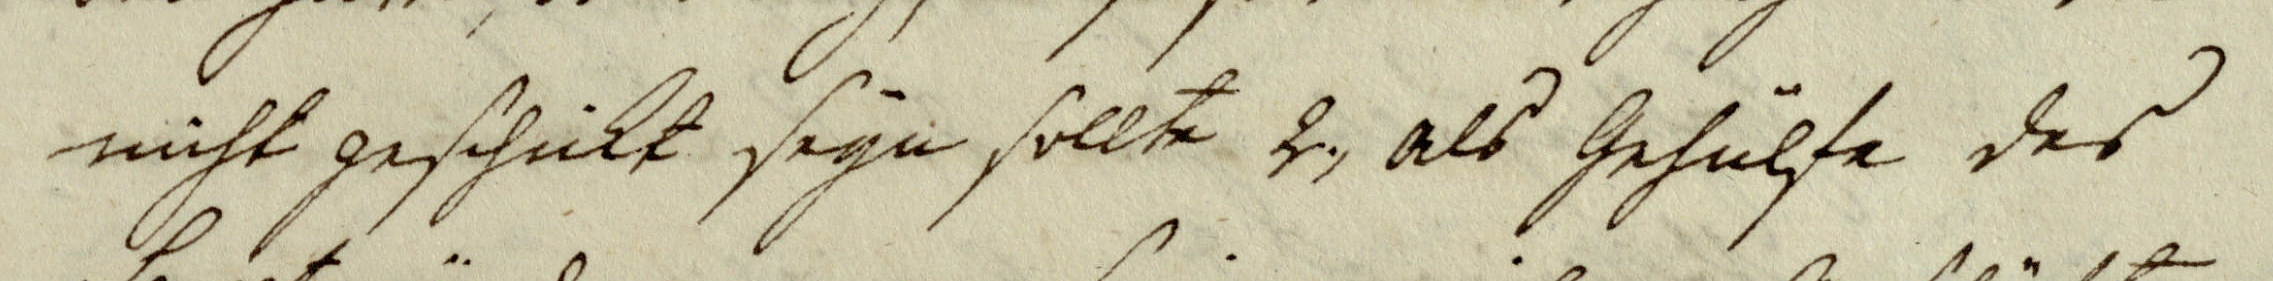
nicht geschickt seÿn sollte 2., als Gehülfe des
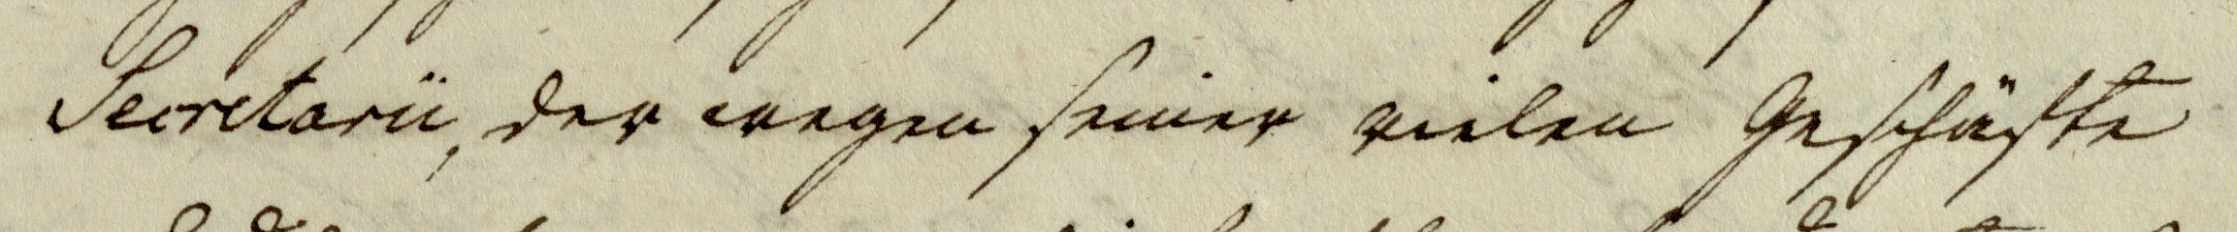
Secretarii, der wegen seiner vielen Geschäfte
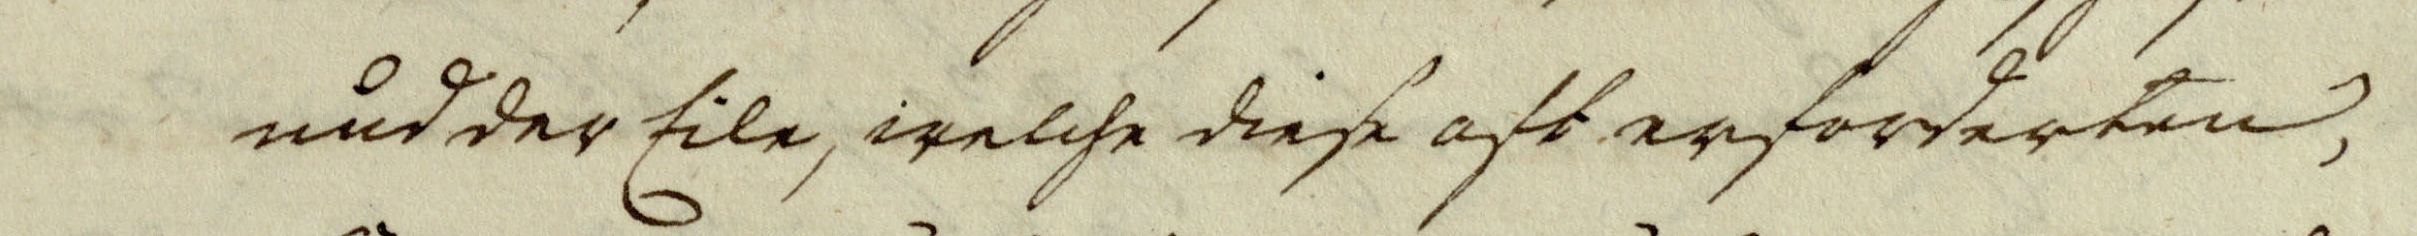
und der Eile, welche diese oft erforderten,
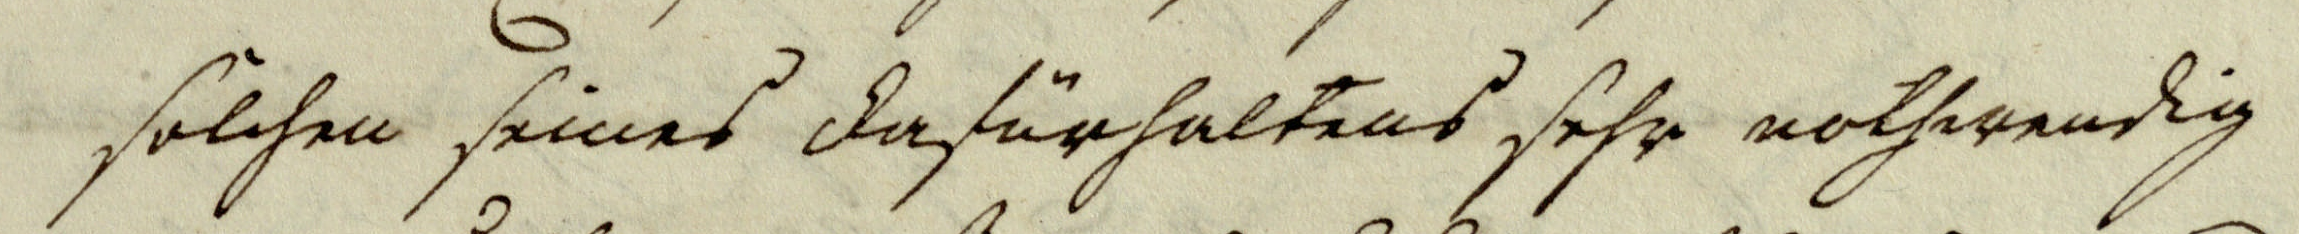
solchen seines Dafürhaltens sehr nothwendig
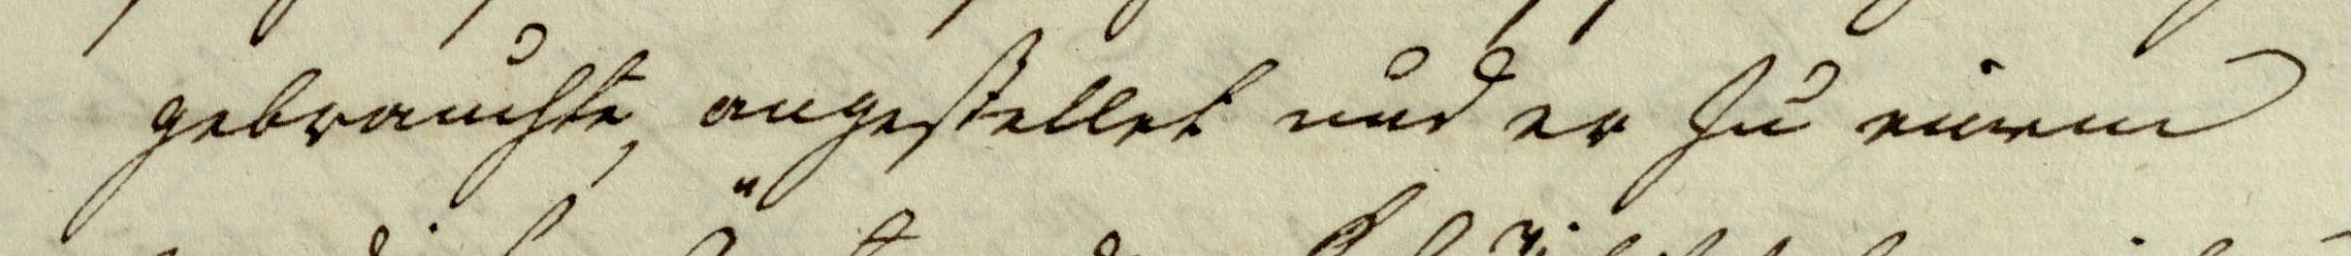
gebrauchte, angestellt und er zu einem
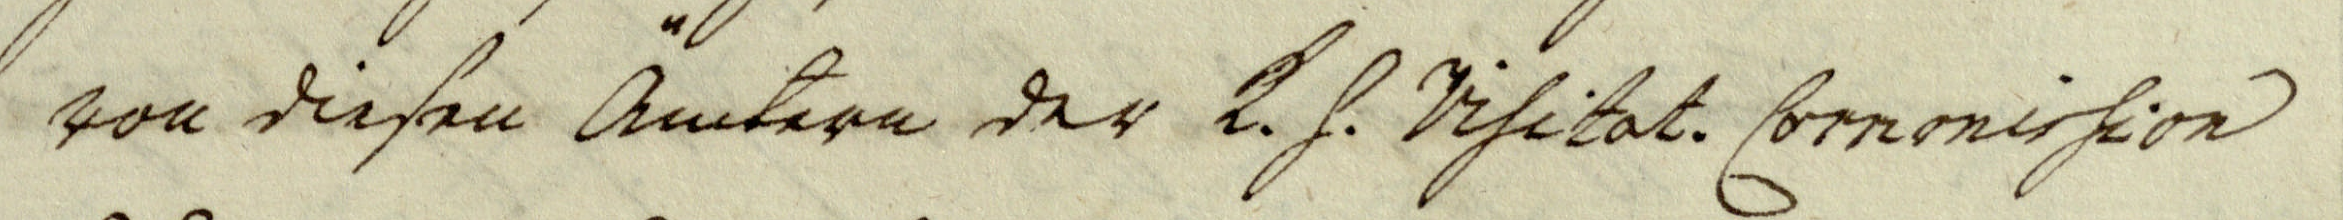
von diesen Ämtern der K. H. Visitat. Commission
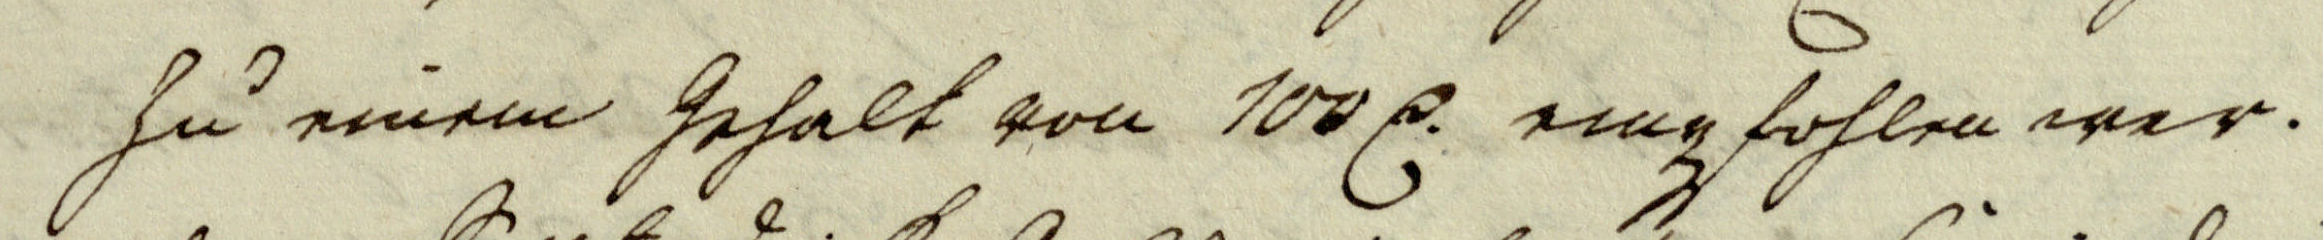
zu einem Gehalt von 100 rtl. empfohlen wer¬
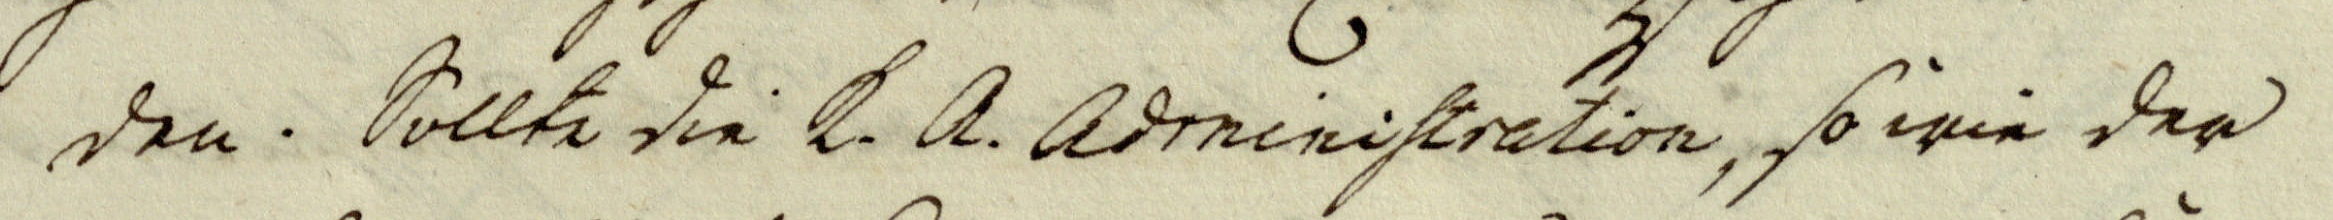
den. Sollte die K. A. Administration, so wie der
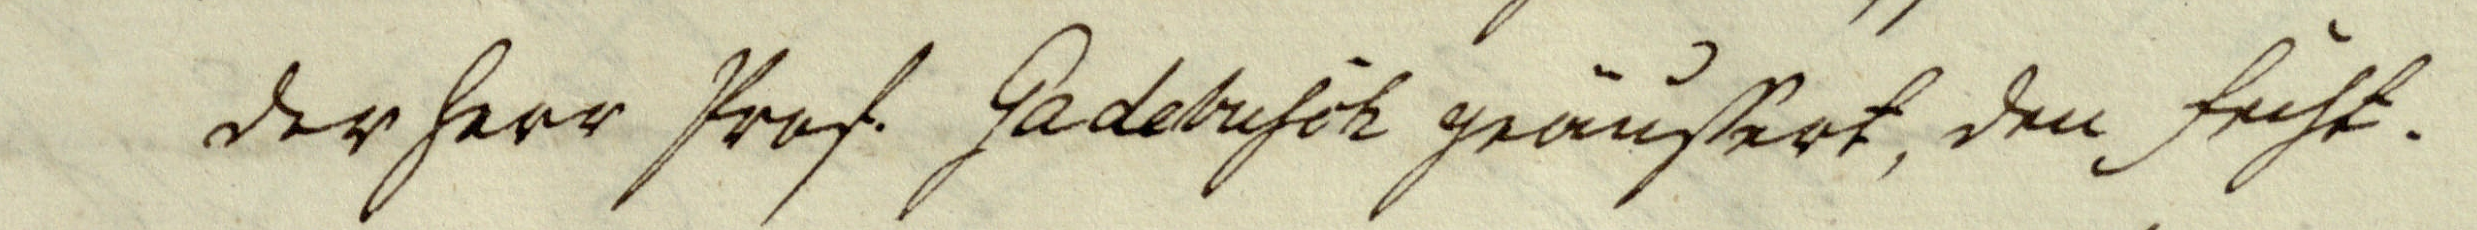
der Herr Prof. Gadebusch geäussert, den Fecht¬
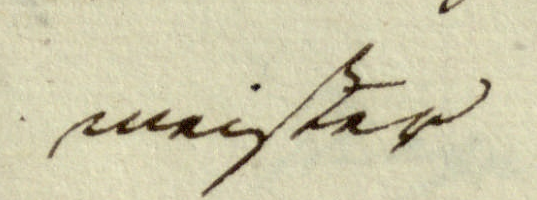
meister
